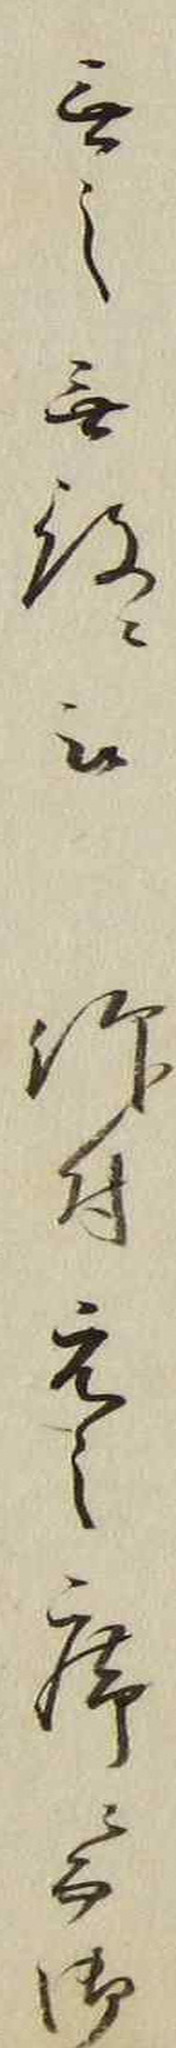無之無役ニ被仰付元之席ニ而御

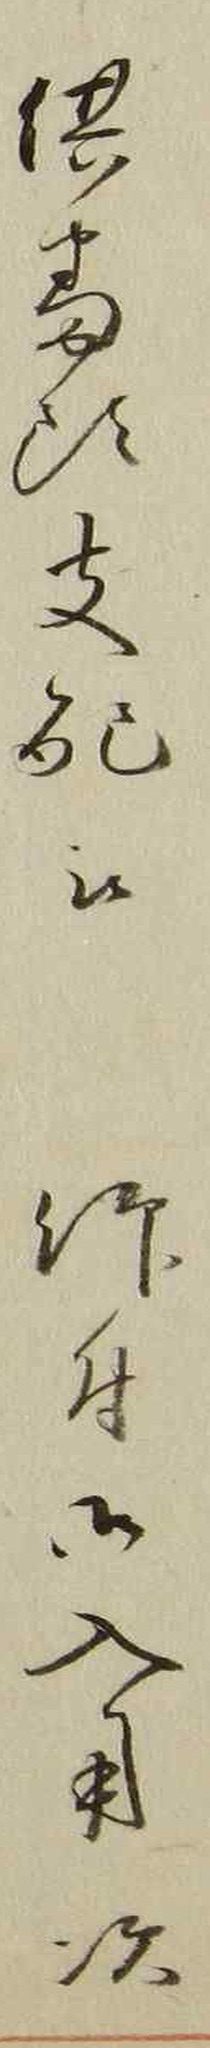供番頭支配被仰付御入用次
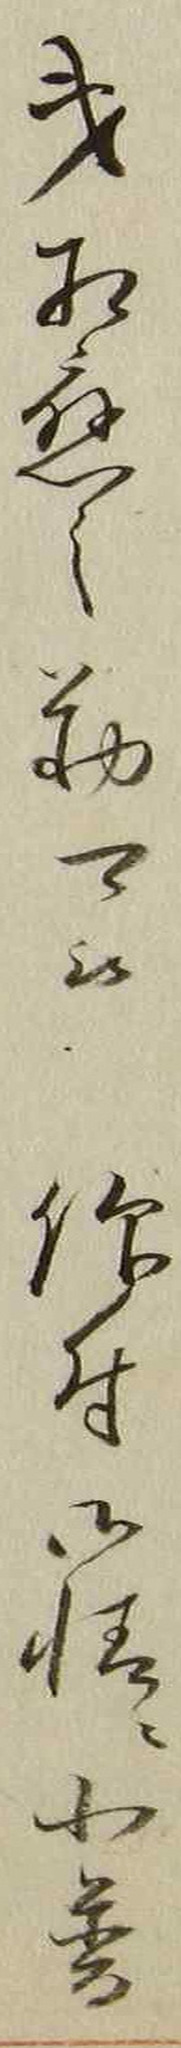第相応之勤可被仰付御情ニ小普
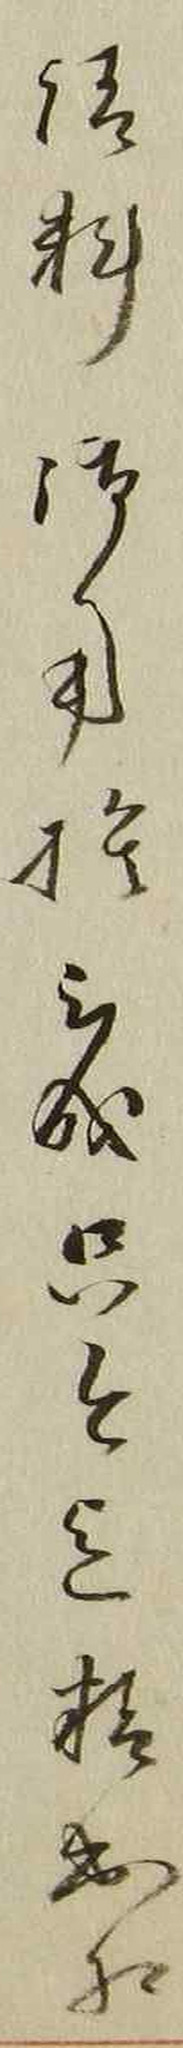請料御用捨被成只今迄精出相
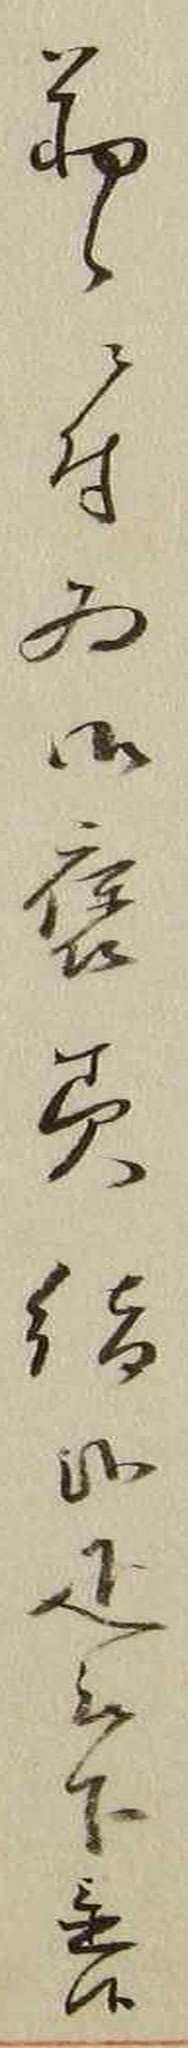勤候ニ付為御褒美絹弐疋被下置候
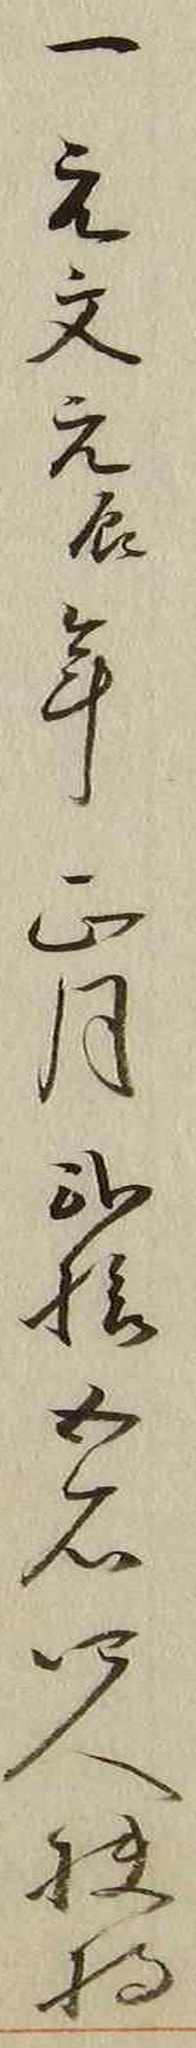一元文元辰年正月弐拾五石四人扶持
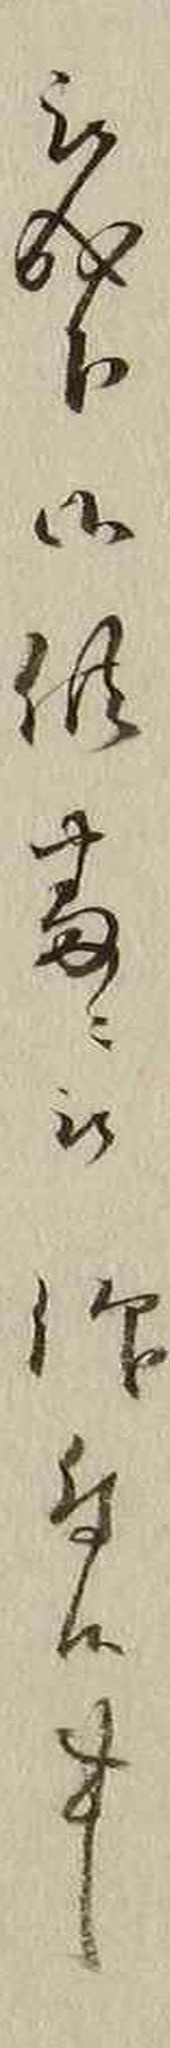被成下御供番ニ被仰付候事
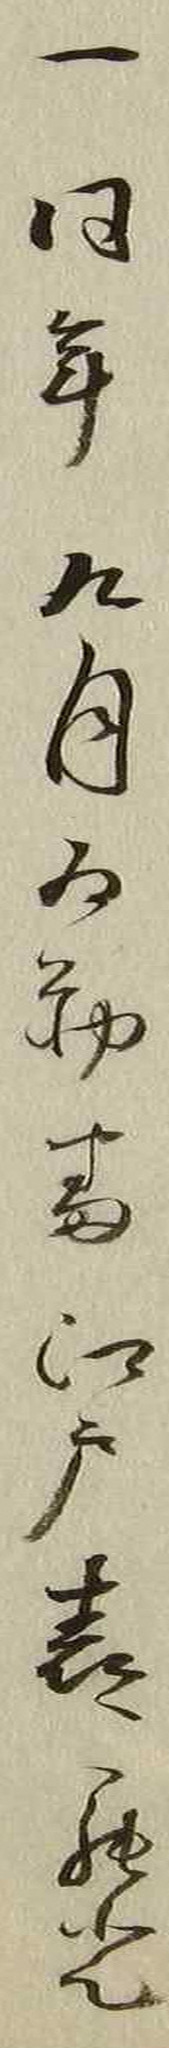一同年九月為勤番江戸表へ罷登
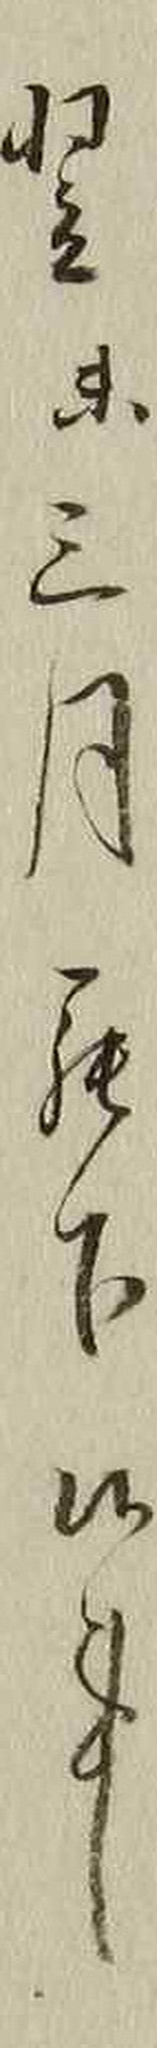翌未三月罷下候事
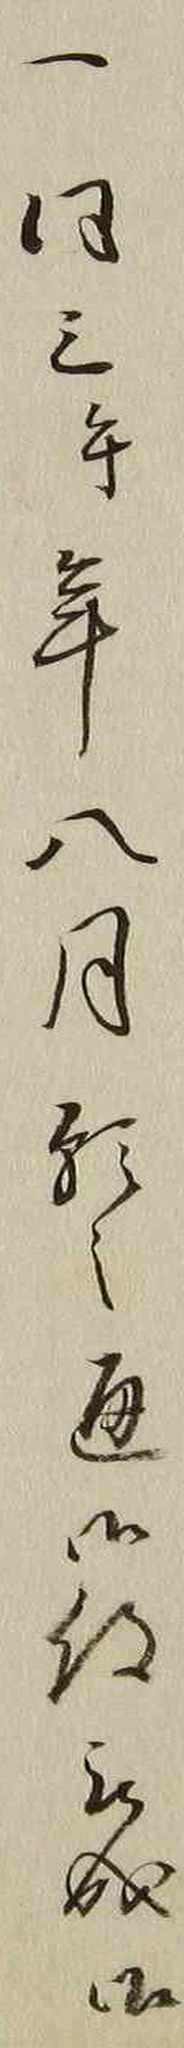一同三午年八月願之通御役被成御
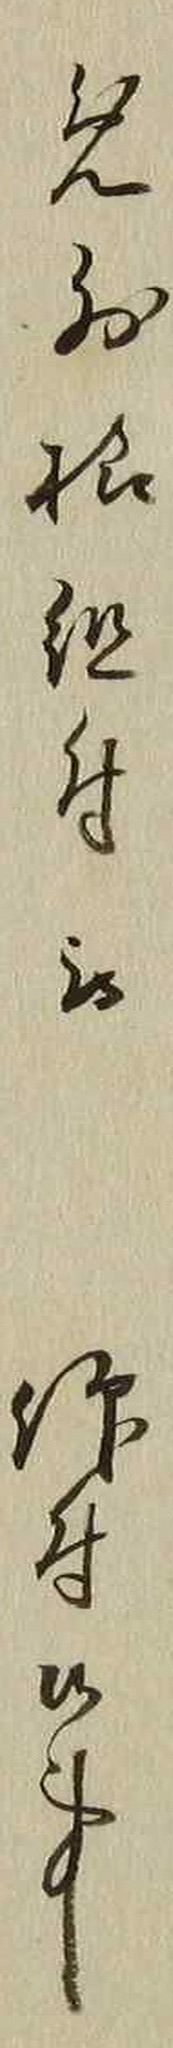免外様組付被仰付候事
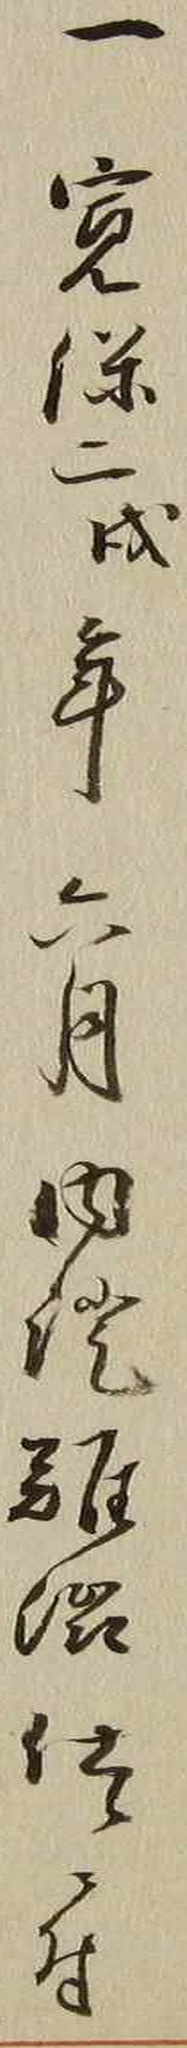一寛保二戌年六月内証難渋仕候ニ付
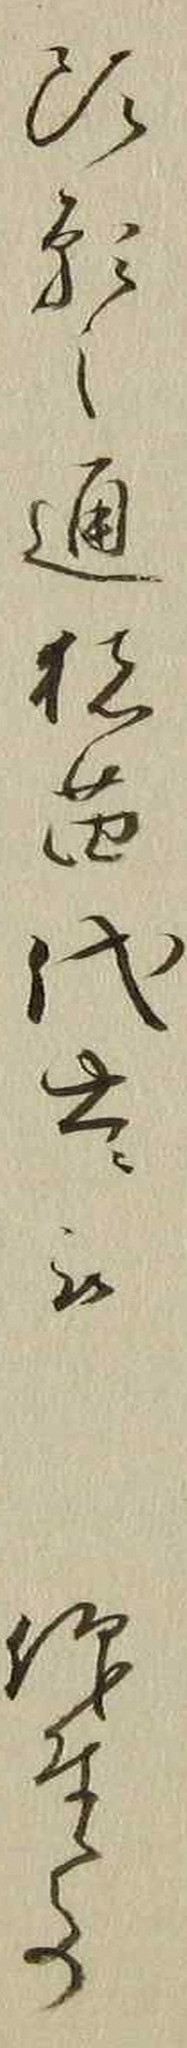頭願之通猪苗代士ニ被仰付候事
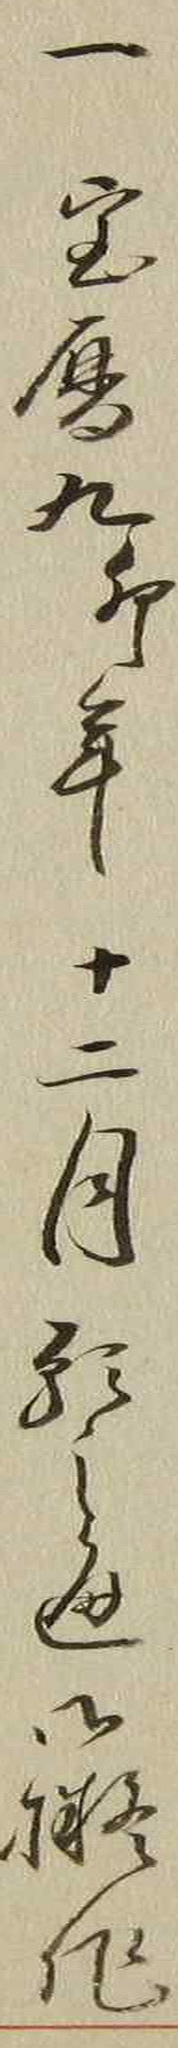一宝暦九卯年十二月願之通御擬作
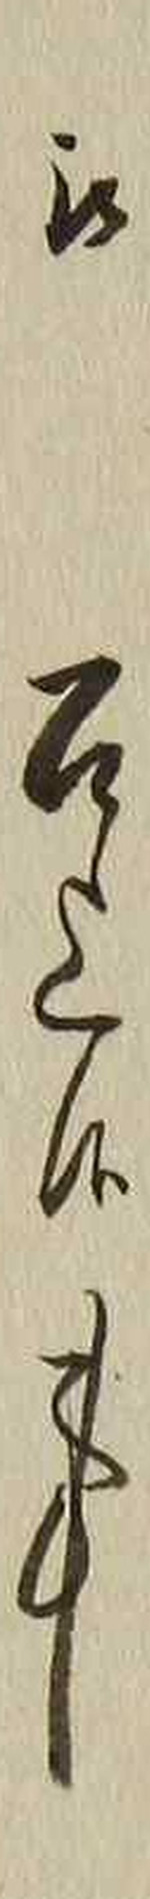被召上候事
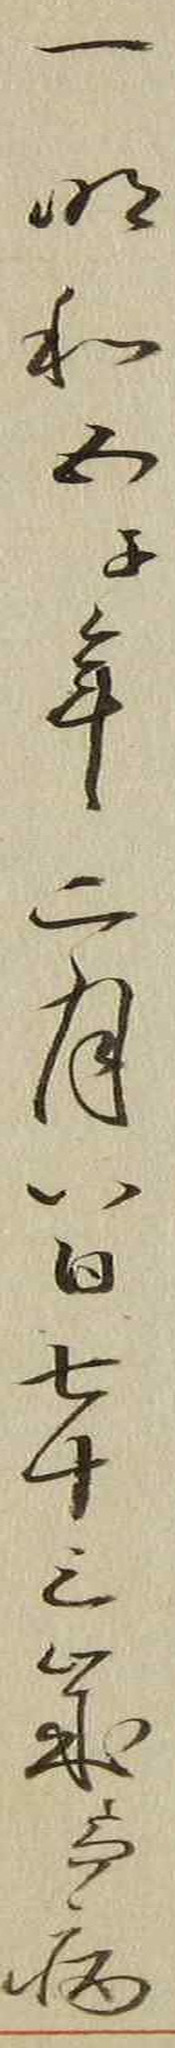一明和五子年二月八日七十三歳ニ而病
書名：諸士系譜　巻之32　い之部32
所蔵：会津若松市立会津図書館
